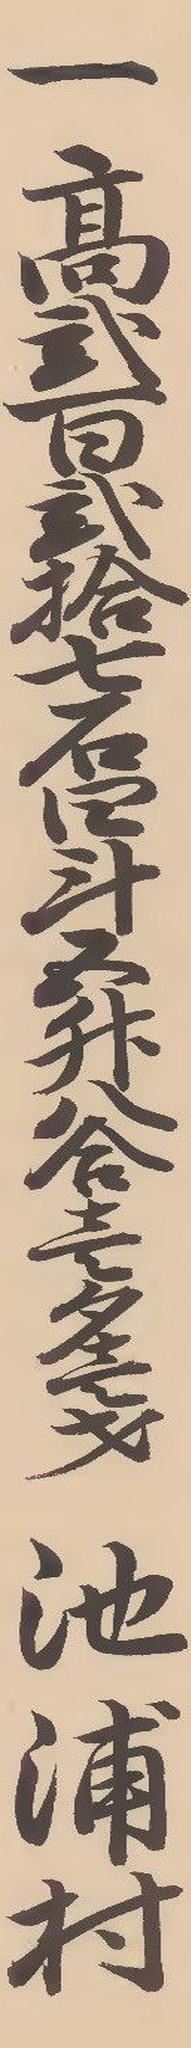一高弐百弐拾七石四斗五升八合壱勺壱才池浦村
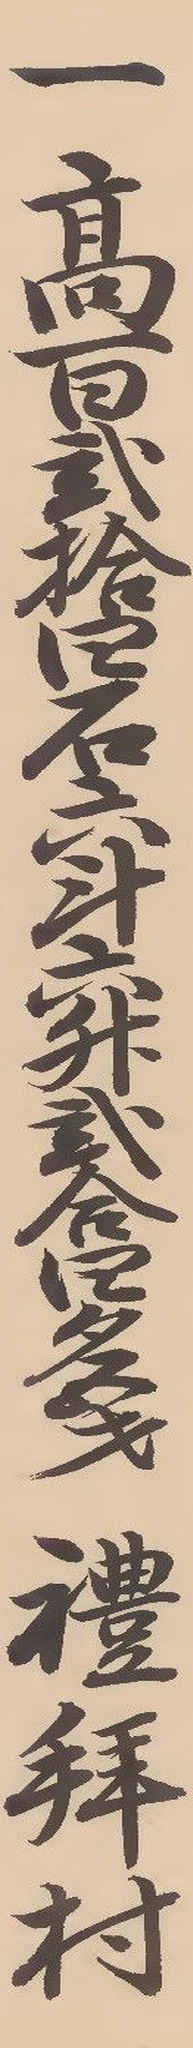一高百弐拾四石六斗六升弐合四勺五才礼拝村
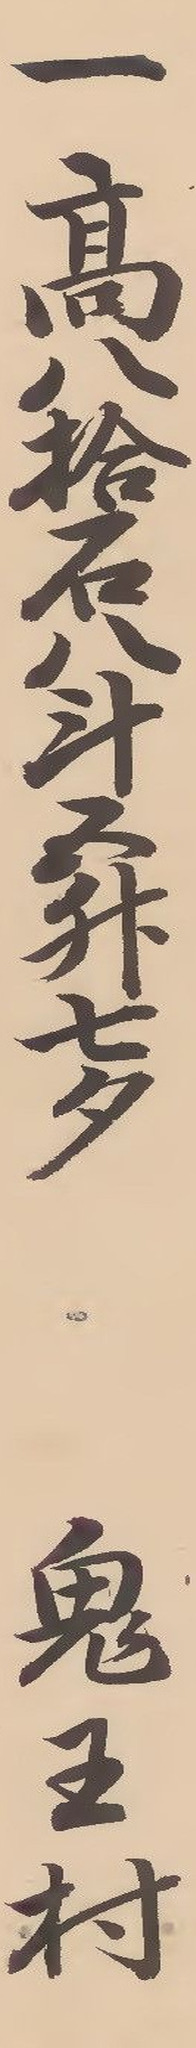一高八拾石八斗五升七勺鬼王村

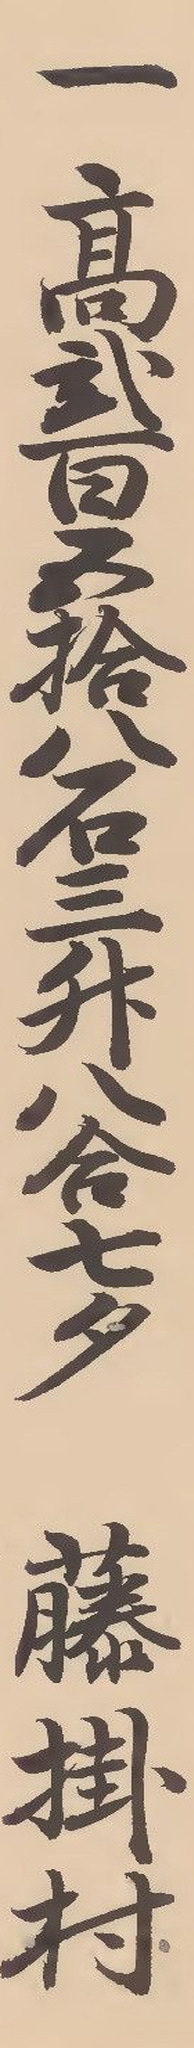一高弐百五拾八石三升八合七勺藤掛村
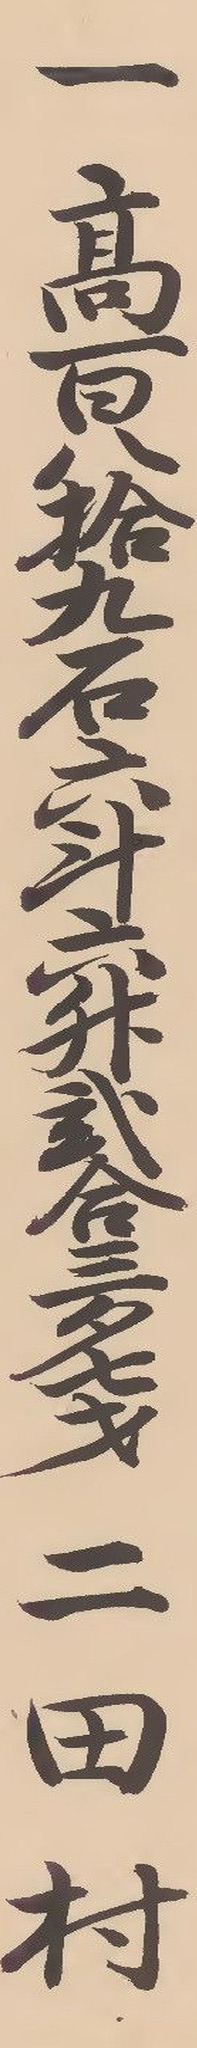一高百八拾九石六斗六升弐合三勺七才二田村
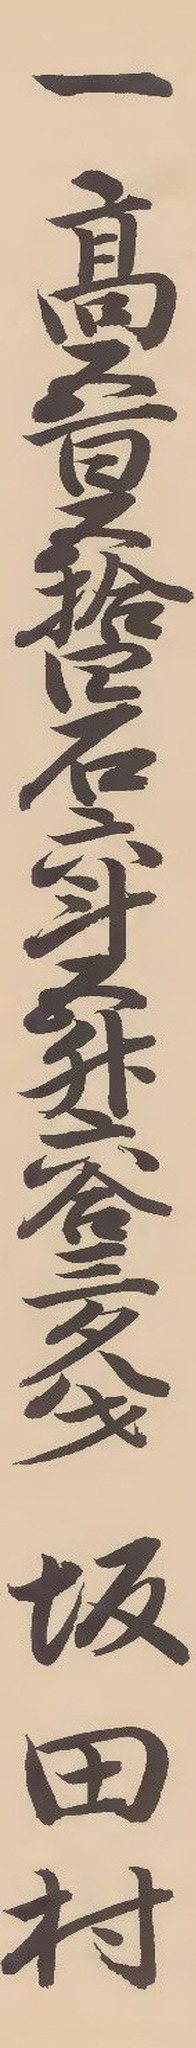一高五百五拾四石六斗五升六合三勺八才坂田村
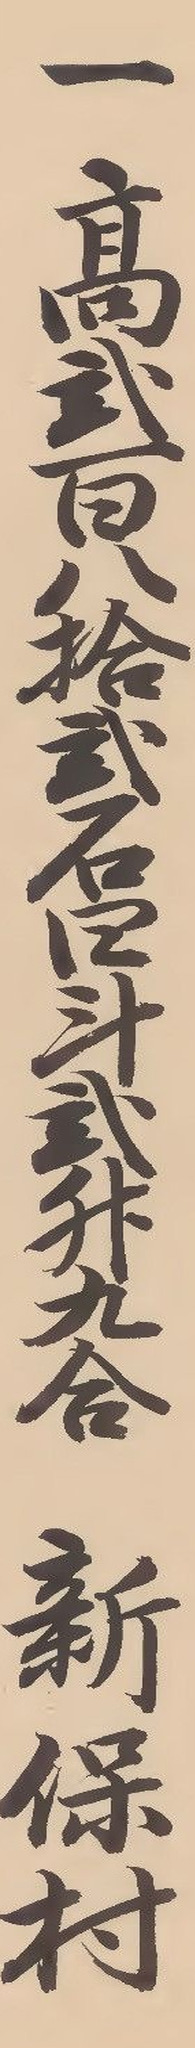一高弐百八拾弐石四斗弐升九合新保村
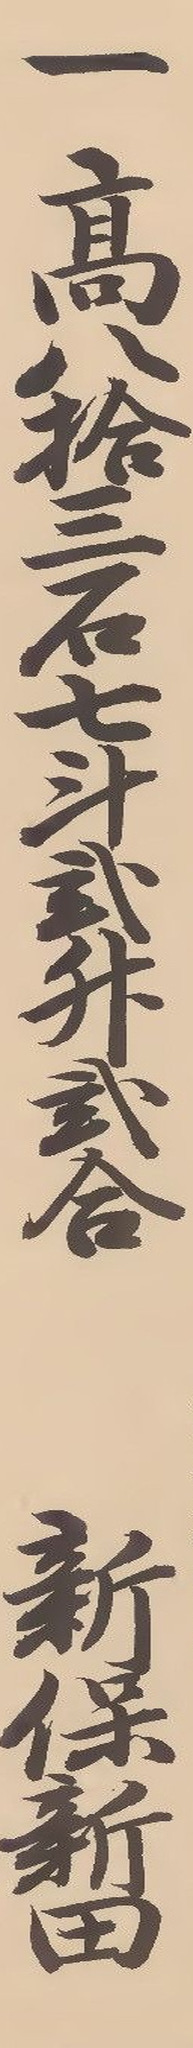一高八拾三石七斗弐升弐合新保新田
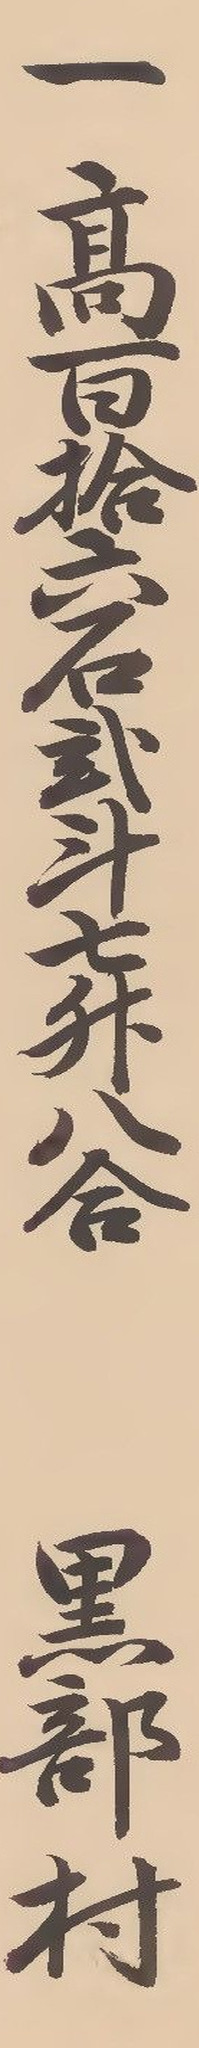一高百拾六石弐斗七升八合黒部村
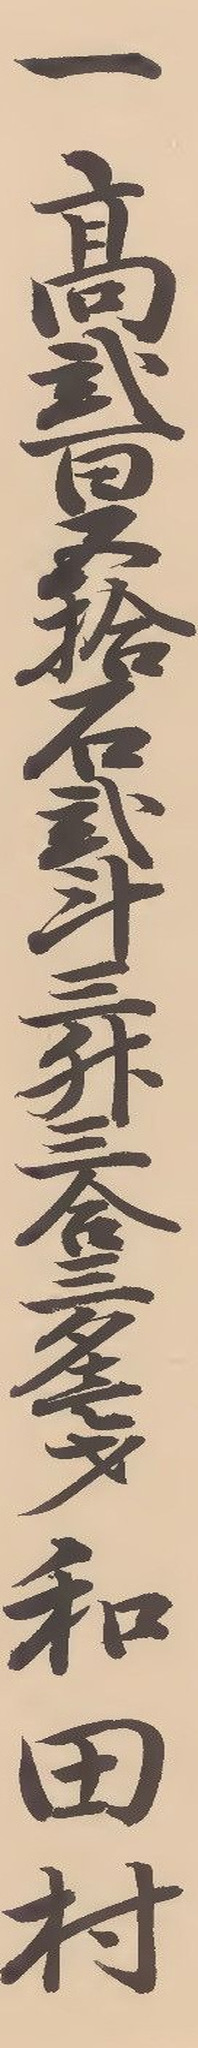一高弐百五拾石弐斗三升三合三勺壱才和田村
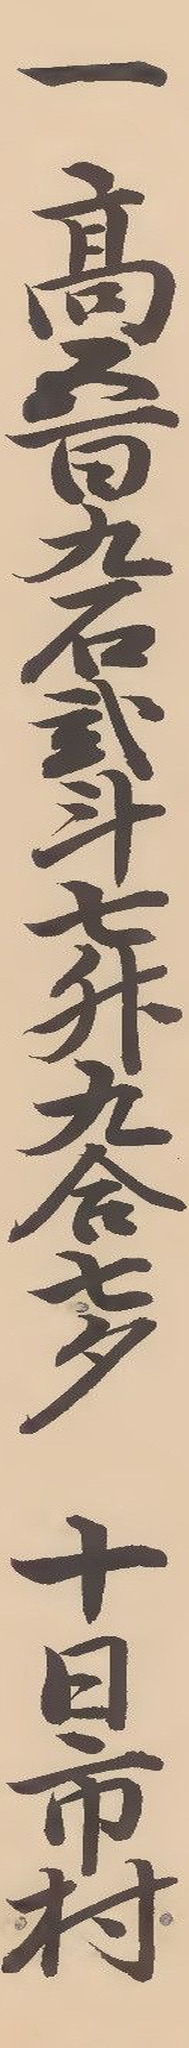一高五百九石弐斗七升九合七勺十日市村

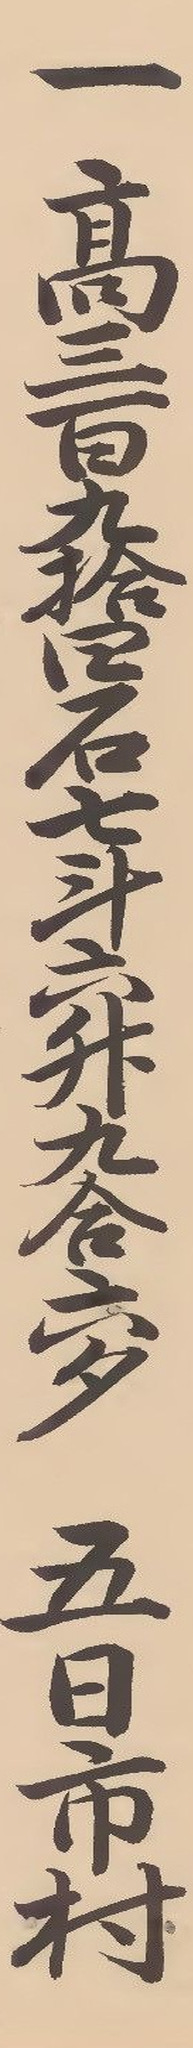一高三百九拾四石七斗六升九合六勺五日市村
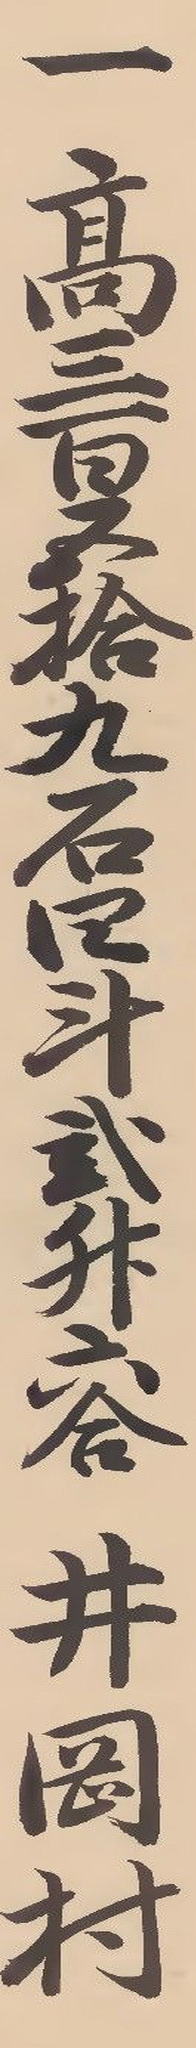一高三百五拾九石四斗弐升六合井岡村
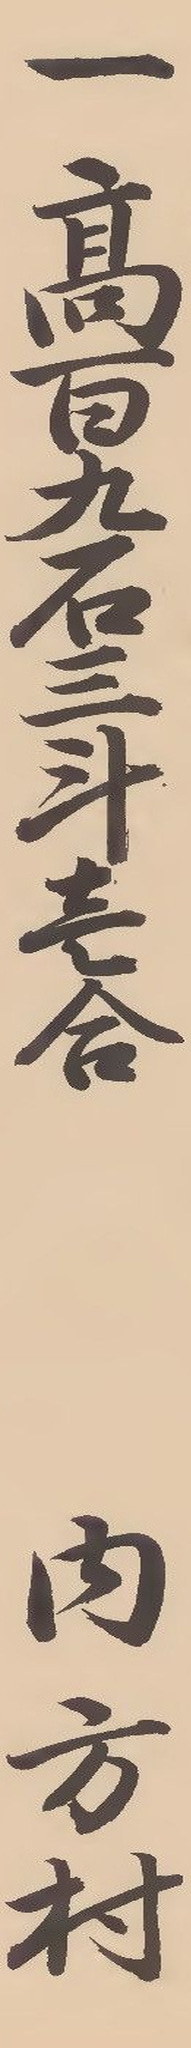一高百九石三斗壱合内方村
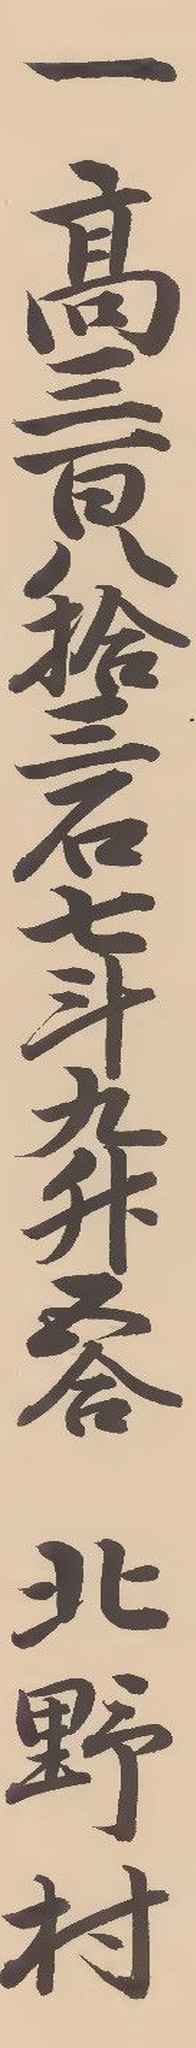一高三百八拾三石七斗九升五合北野村
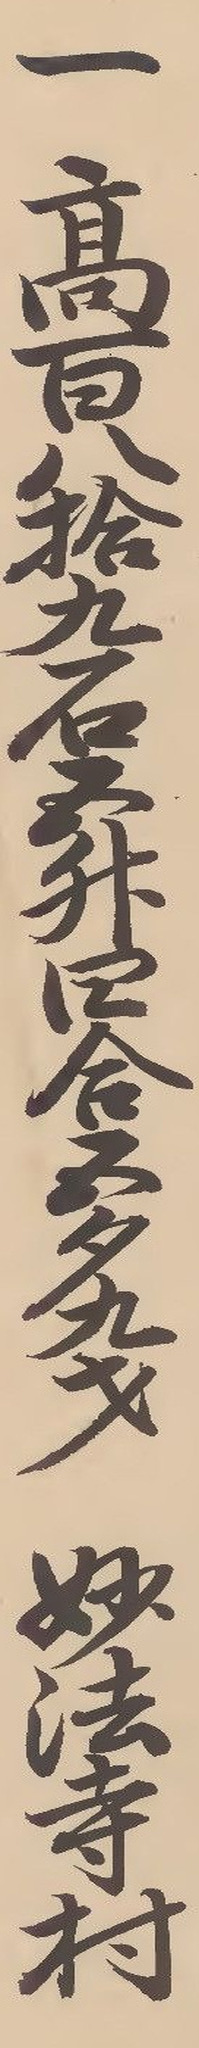一高百八拾九石五升四合五勺九才妙法寺村
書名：越後国郷帳　中
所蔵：国立公文書館 National Archives of Japan
